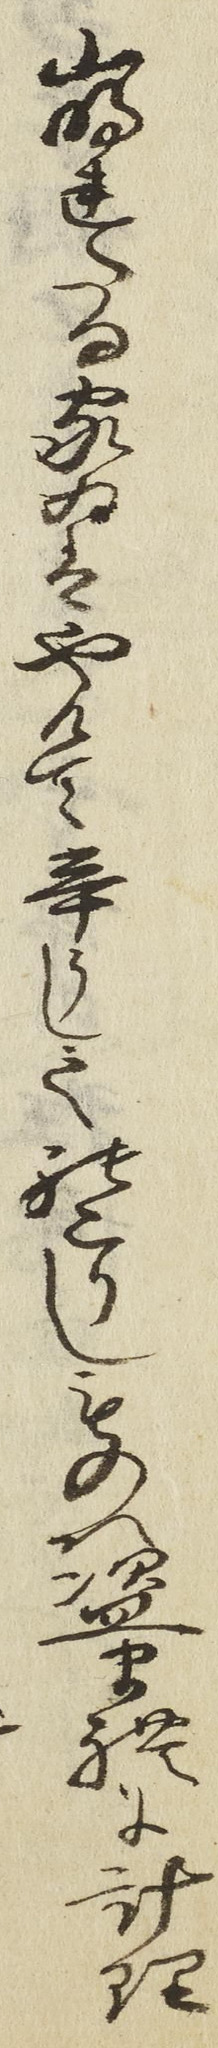崩れたる家ゐはやけて辛うしてのこりしものは盜まれにけり
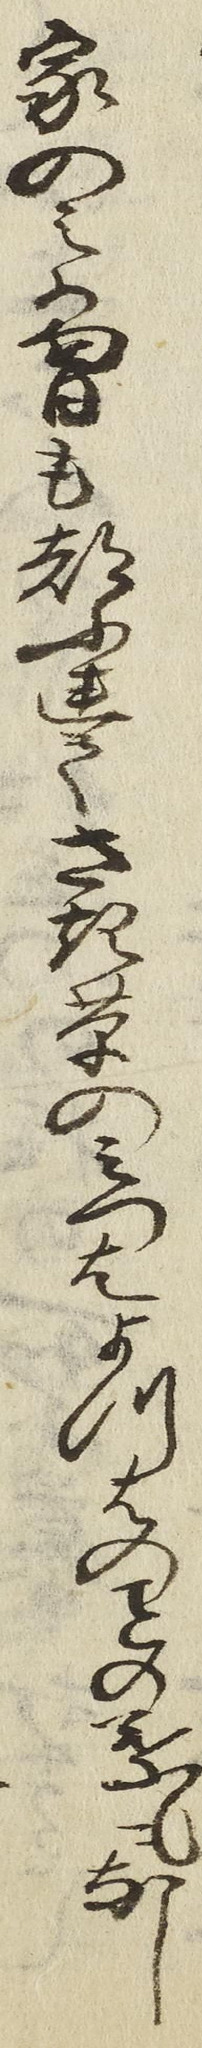家のみか胸もつふれてさき草のみつはよつはのことの葉もなし
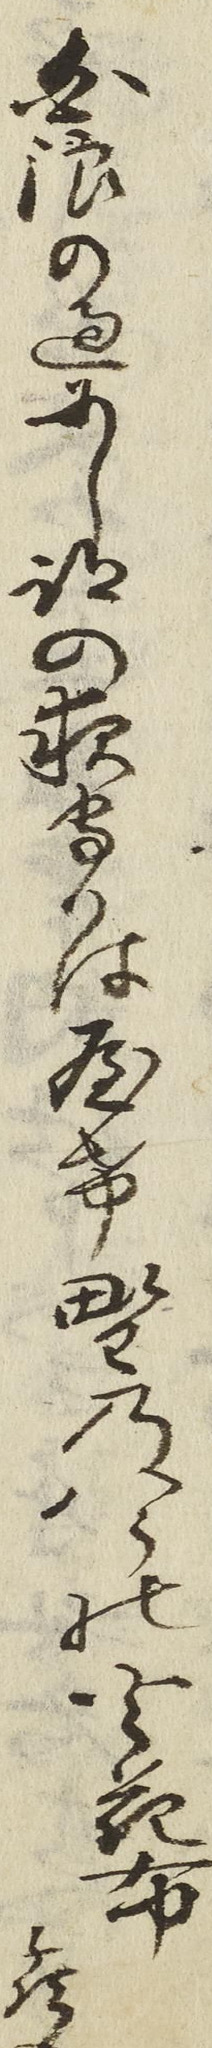白浪の過にし跡の夜守はやけ野のはらの火花ふ声
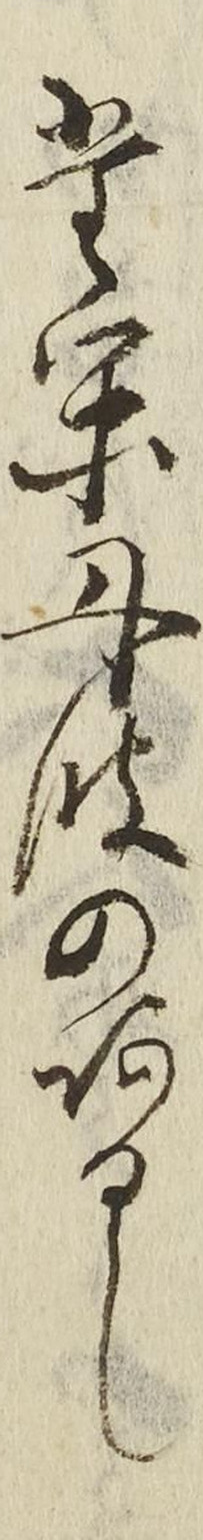堂閑丹波のあるし
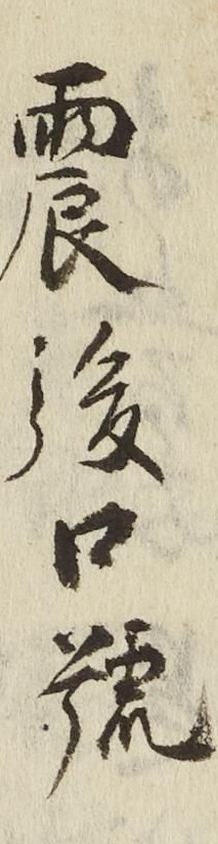震後口号
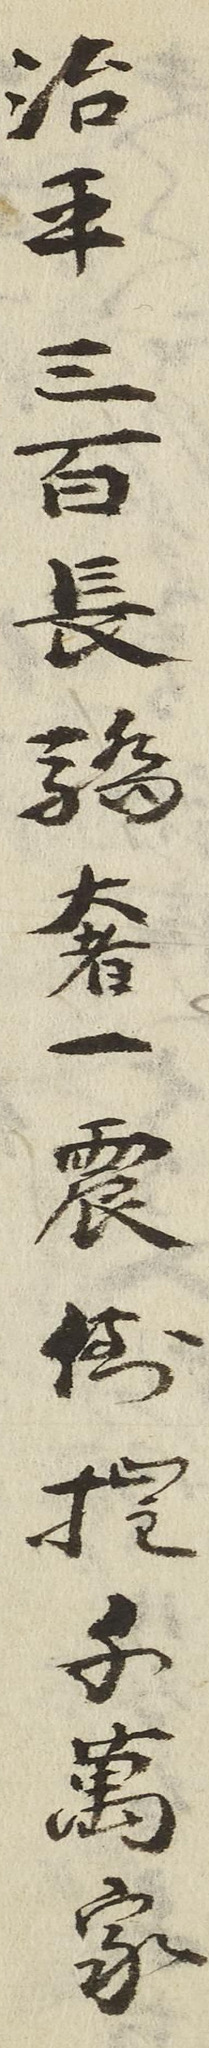治平三百長驕奢一震倒摧千万家
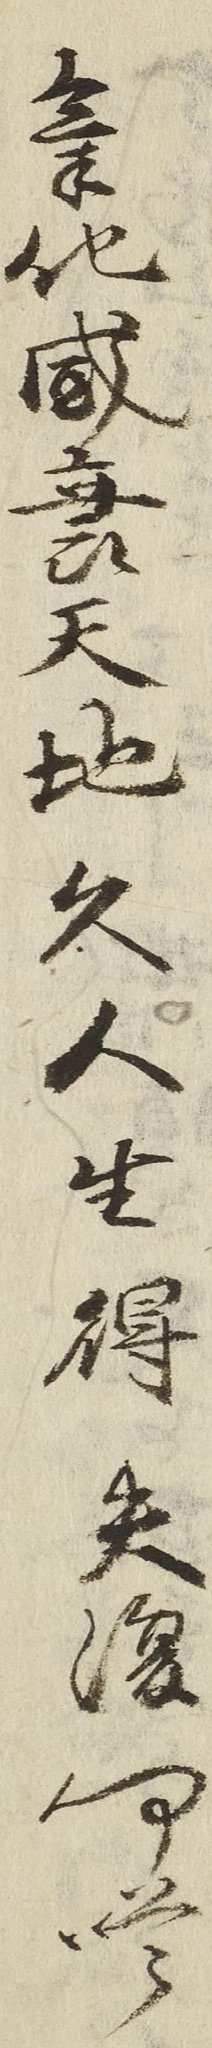気他咸衰天地久人生得失復何
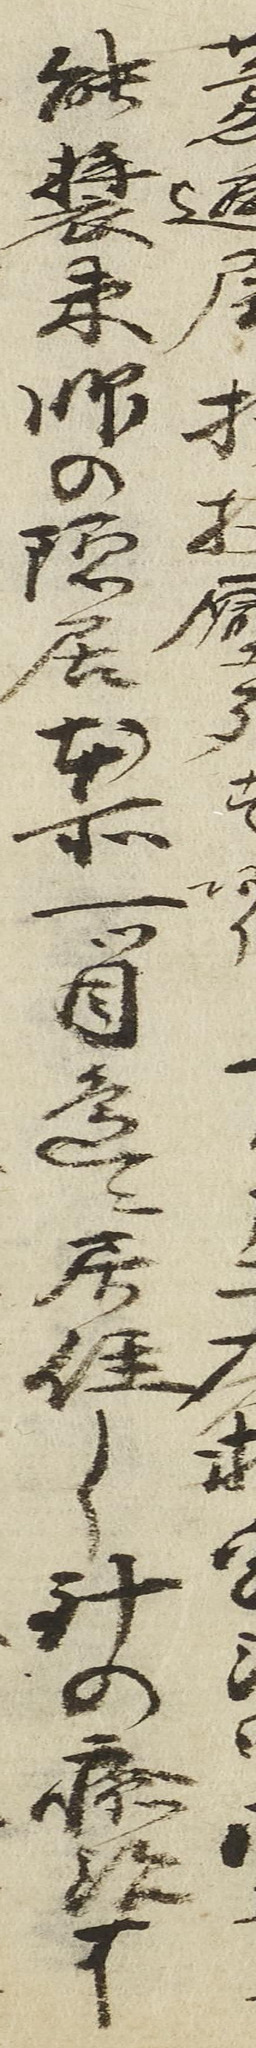能装束師の隠居本所一ツ目辺ニ居住し針の療治に
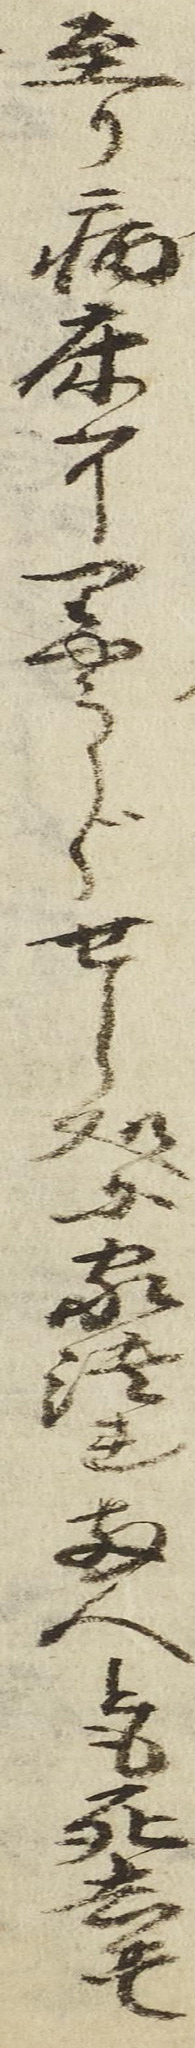至り病床にりやうじせし処に家潰れ両人とも死去す
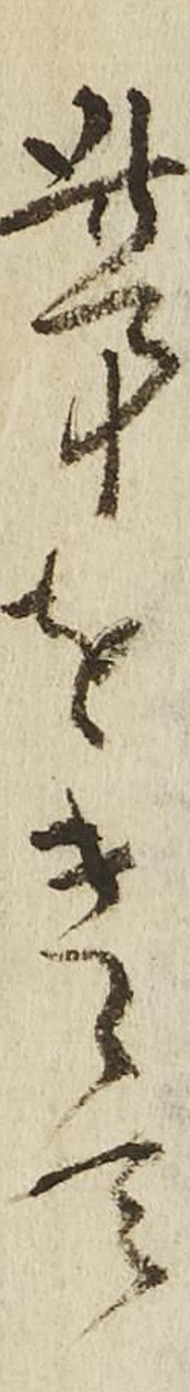此事をきゝて
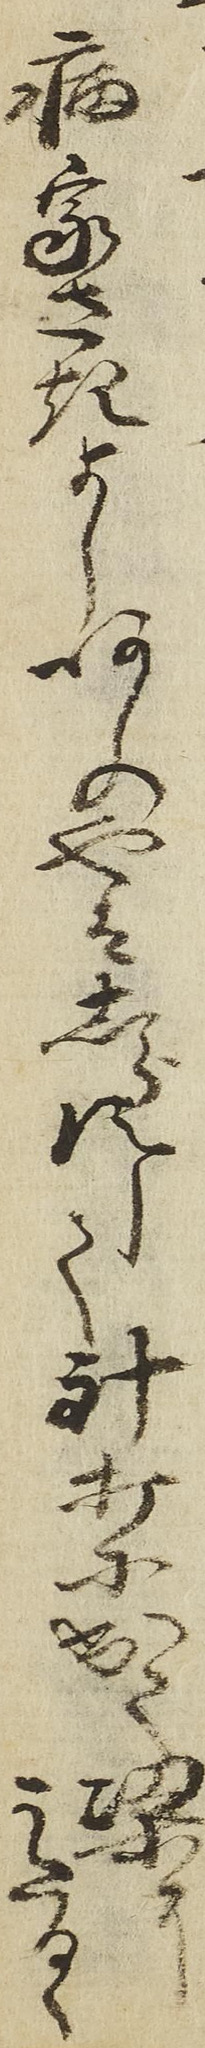病家さきよしあしのやはしらすして針打に出て梁に

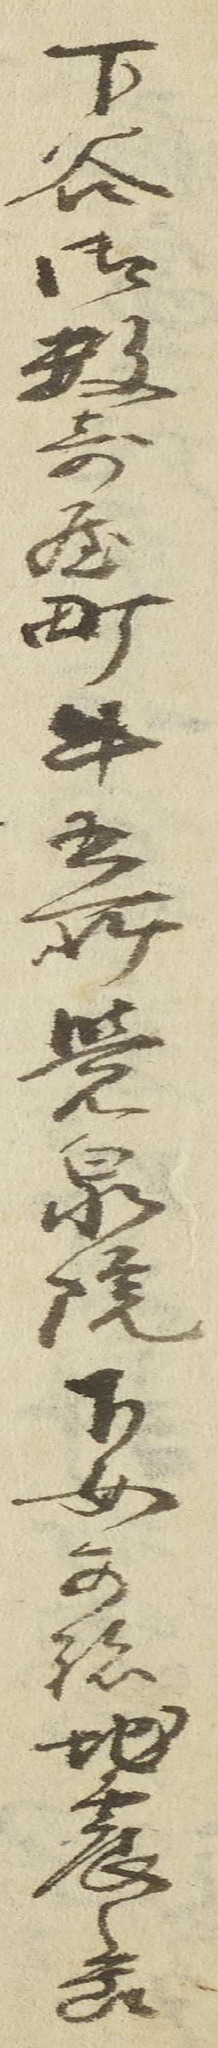下谷御数寄屋町牛王所覚泉院下女かね地震之節
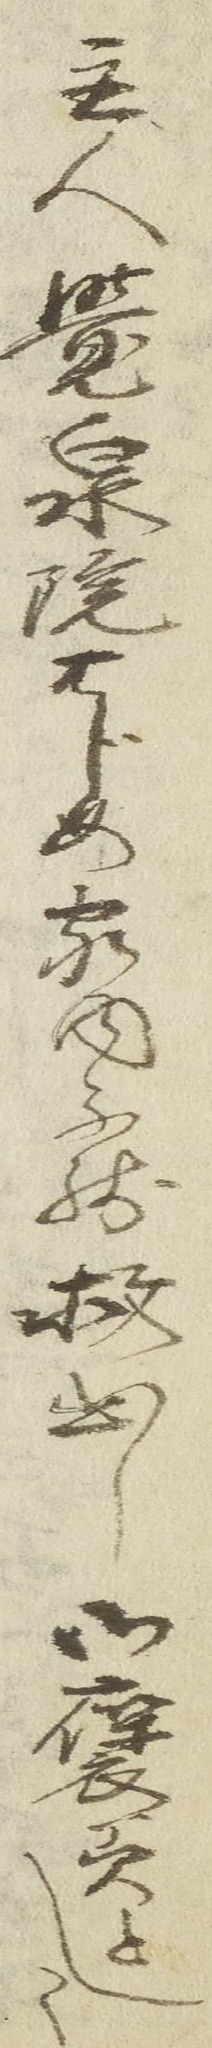主人覚泉院はじめ家内不残救出し御褒美として
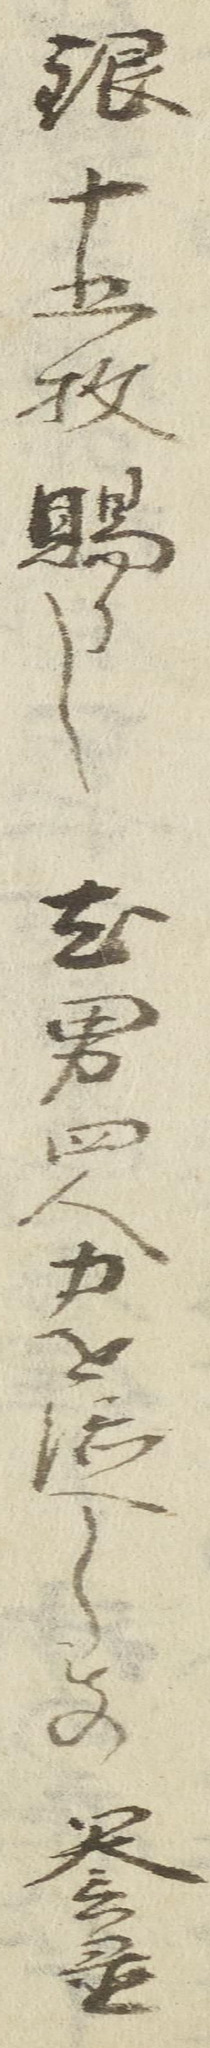銀十五枚賜りし尤男四人力を添へしもの誉置
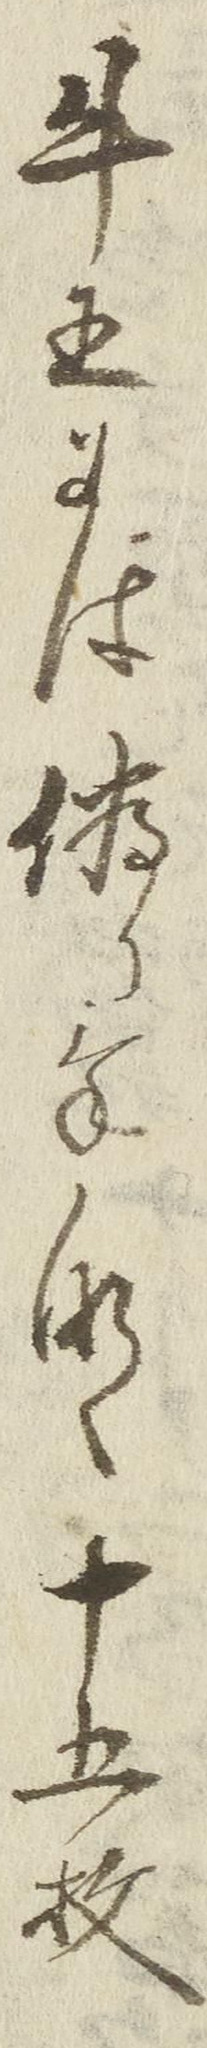牛王には偽り気なく十五枚
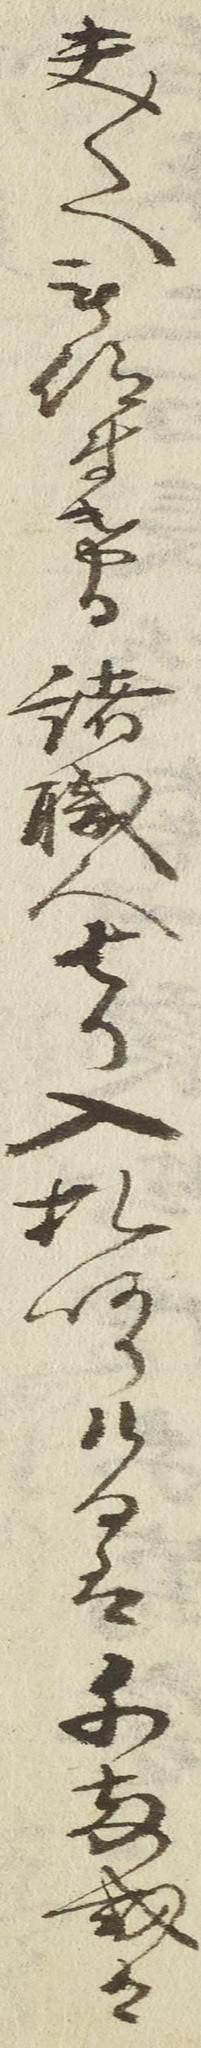夫々へ被仰付ける諸職人より入札ありけるは千両或は
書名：安政二年震災記事　完
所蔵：東京大学地震研究所図書室 Earthquake Research Institute Library, The University of Tokyo, JAPAN
